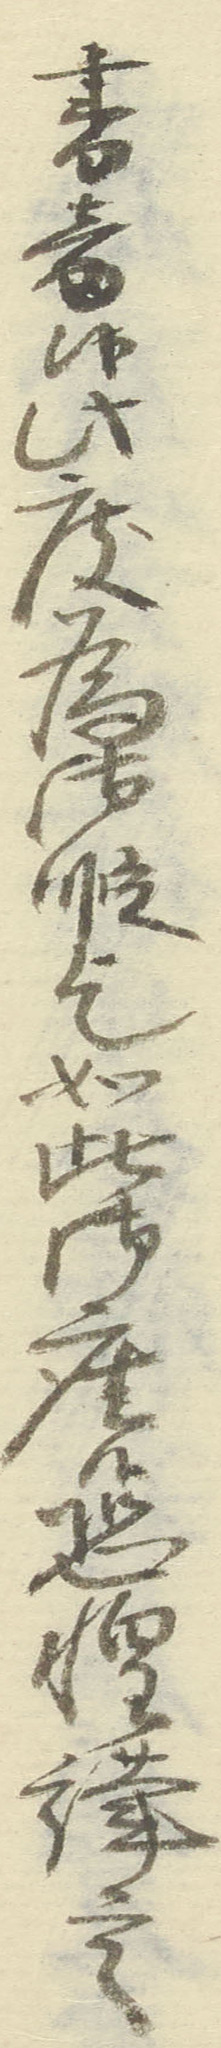書？候此度為御暇乞如此御座候恐惶謹言
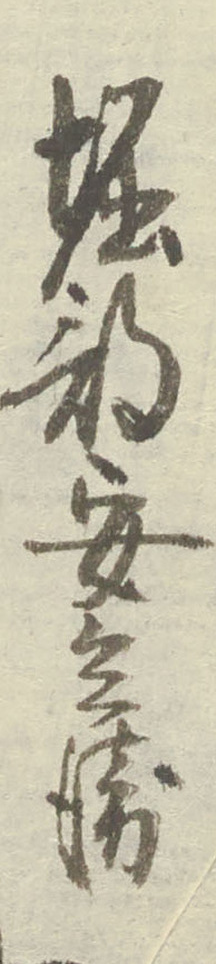堀部安兵衛
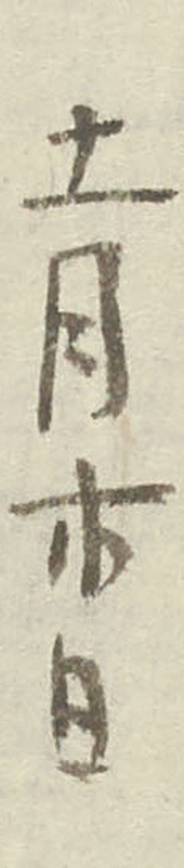十一月廿日
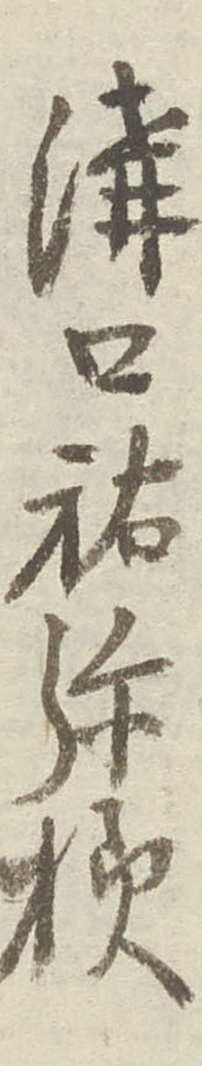溝口祐弥様
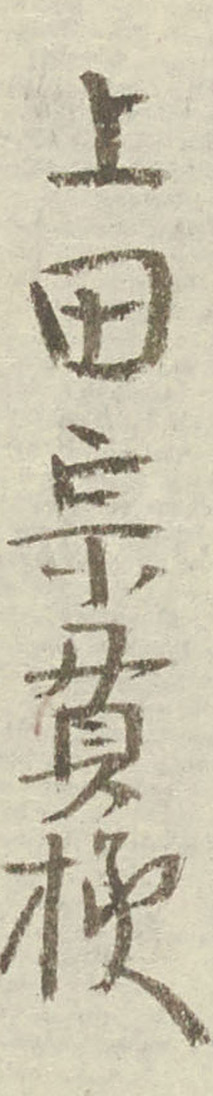上田宗貫様
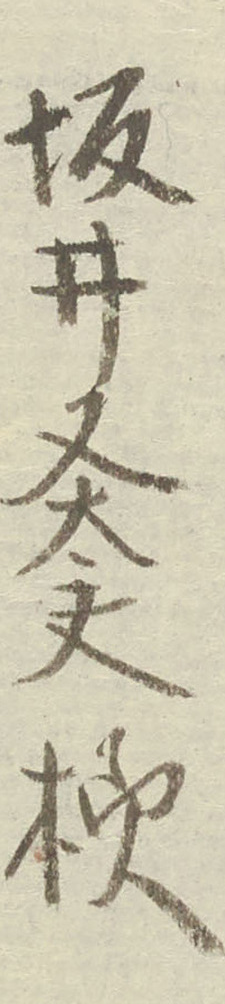坂井又太夫様
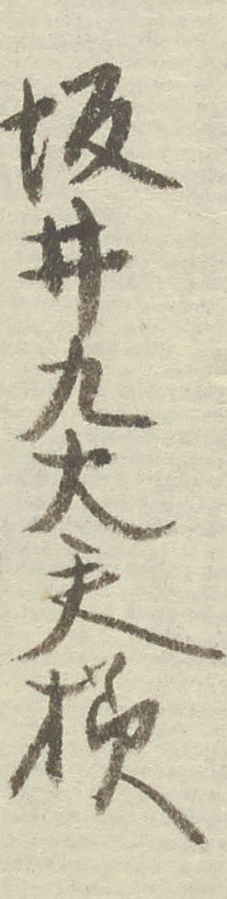坂井又太夫様
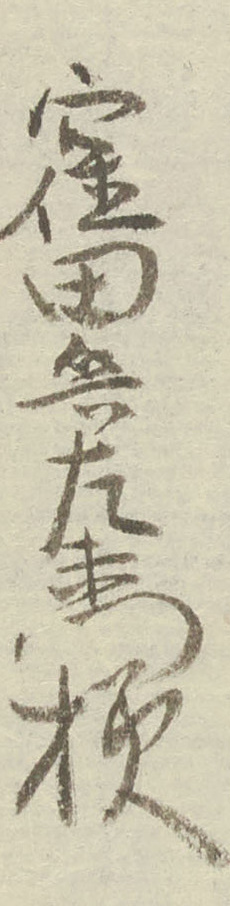窪田兵左衛門様
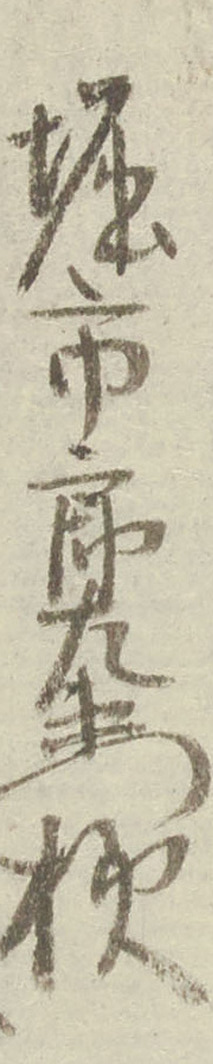堀市郎左衛門様
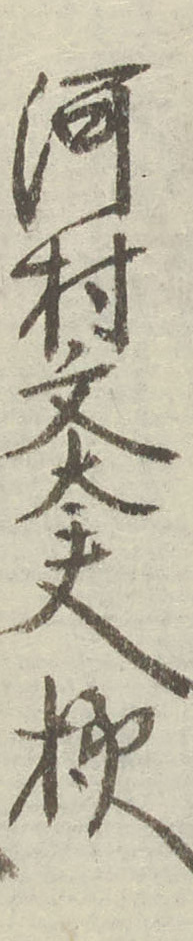河村文太夫様
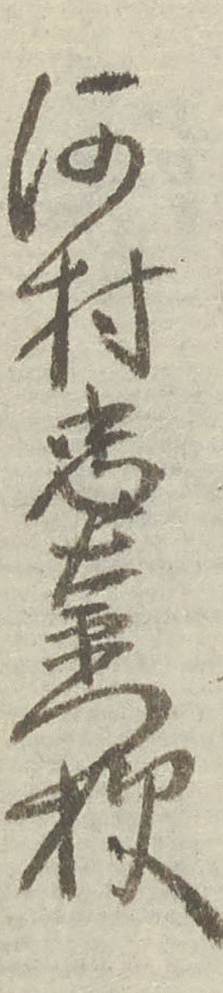河村仲右衛門様

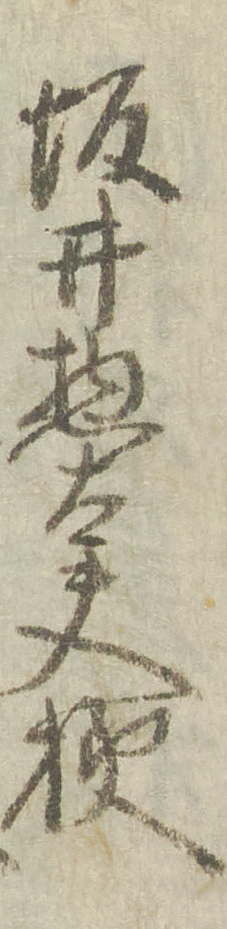坂井惣太夫様
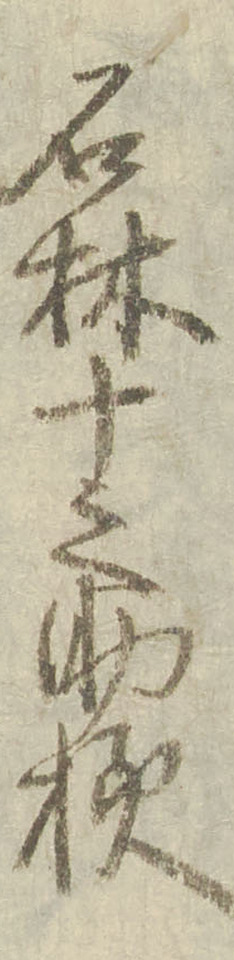石林十之助様
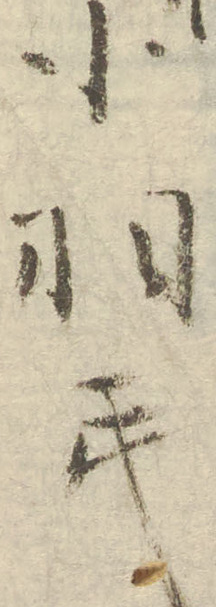小羽氏
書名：[七月二日京都大地震に付御番衆大木市左衛門より申し越し候書面畧書状写]
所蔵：東京大学総合図書館 General Library in the University of Tokyo, JAPAN
